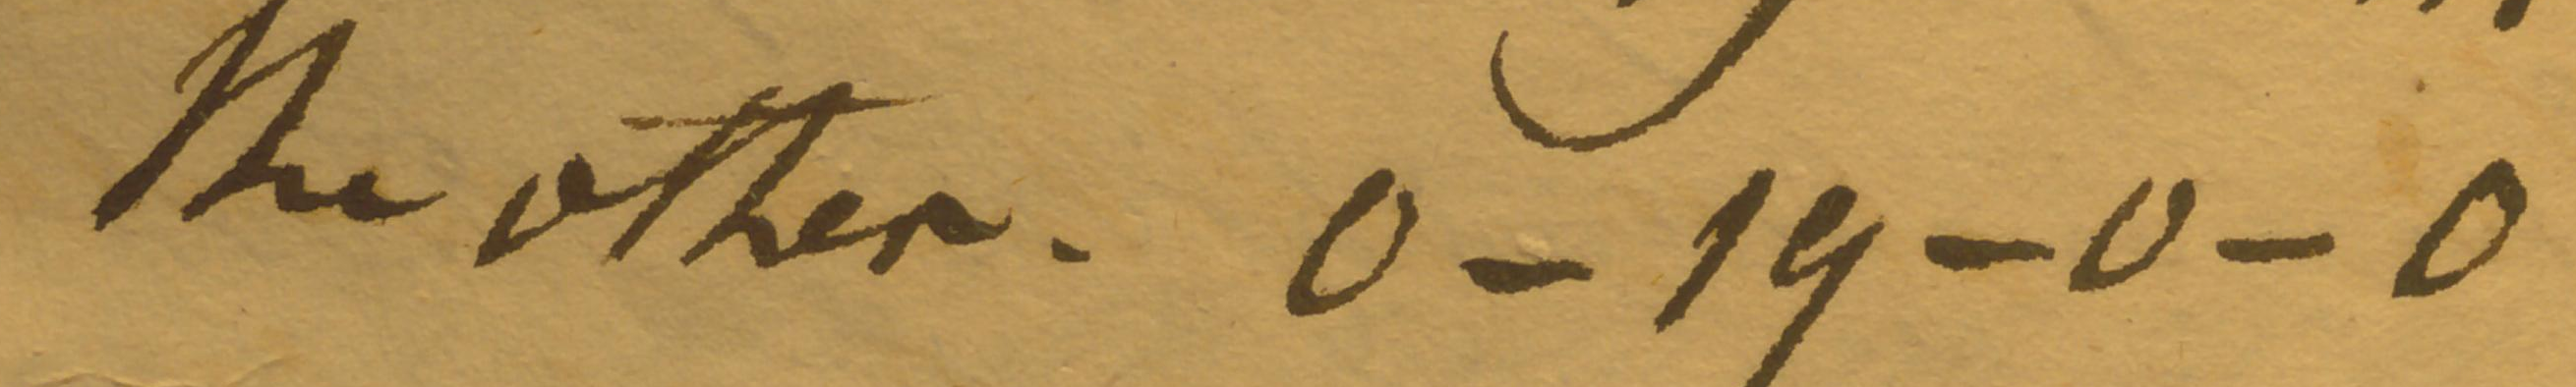The other. 0-19-0-0
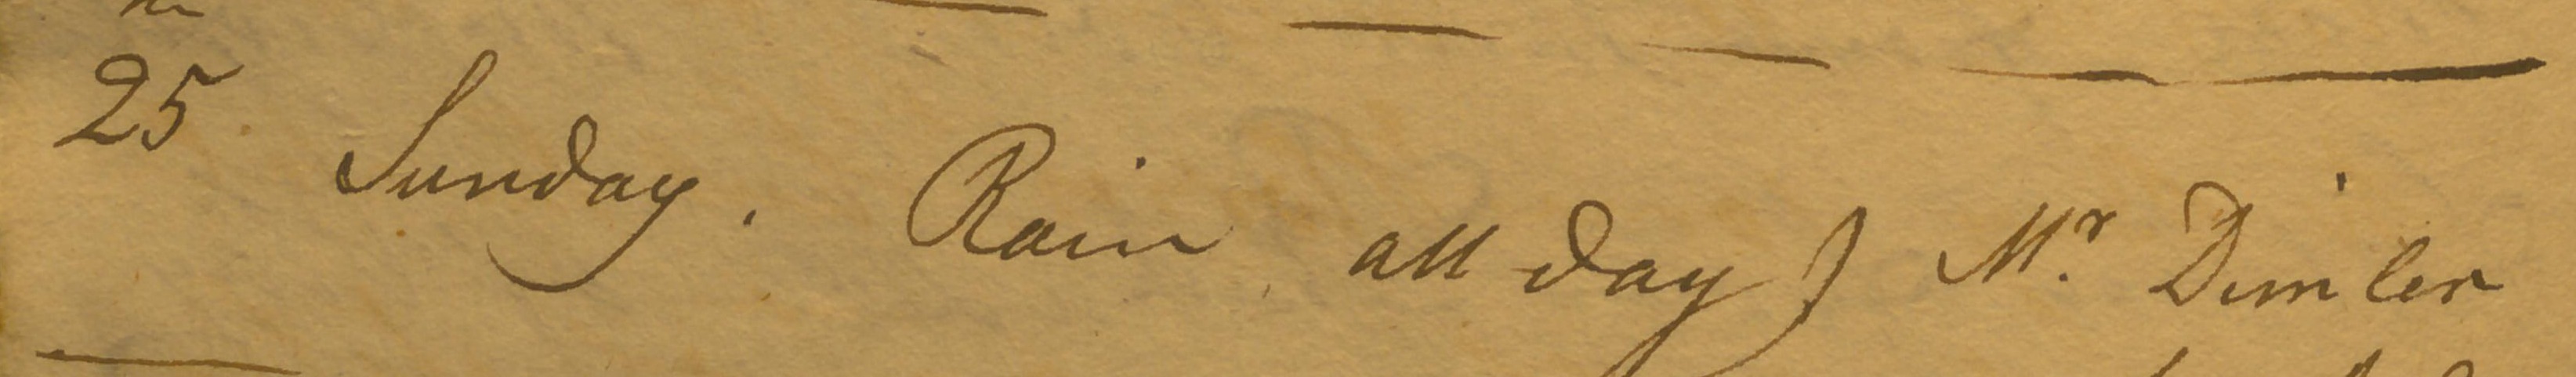25^th Sunday. Rain all day I M^r. Dimler
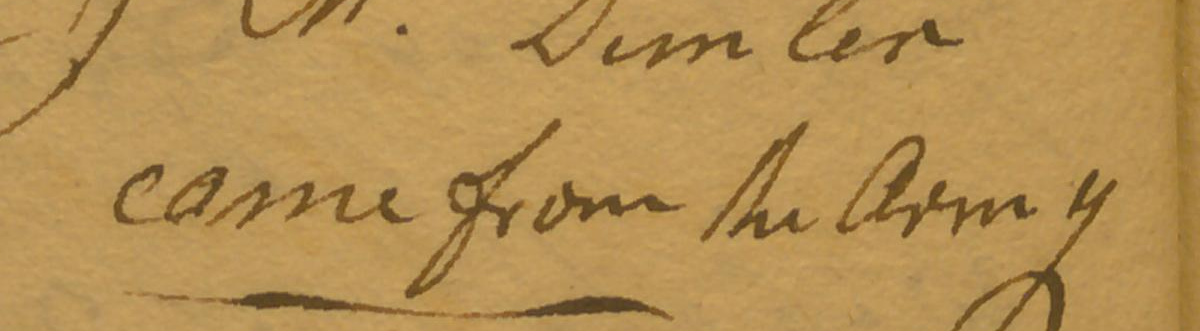came from the Army
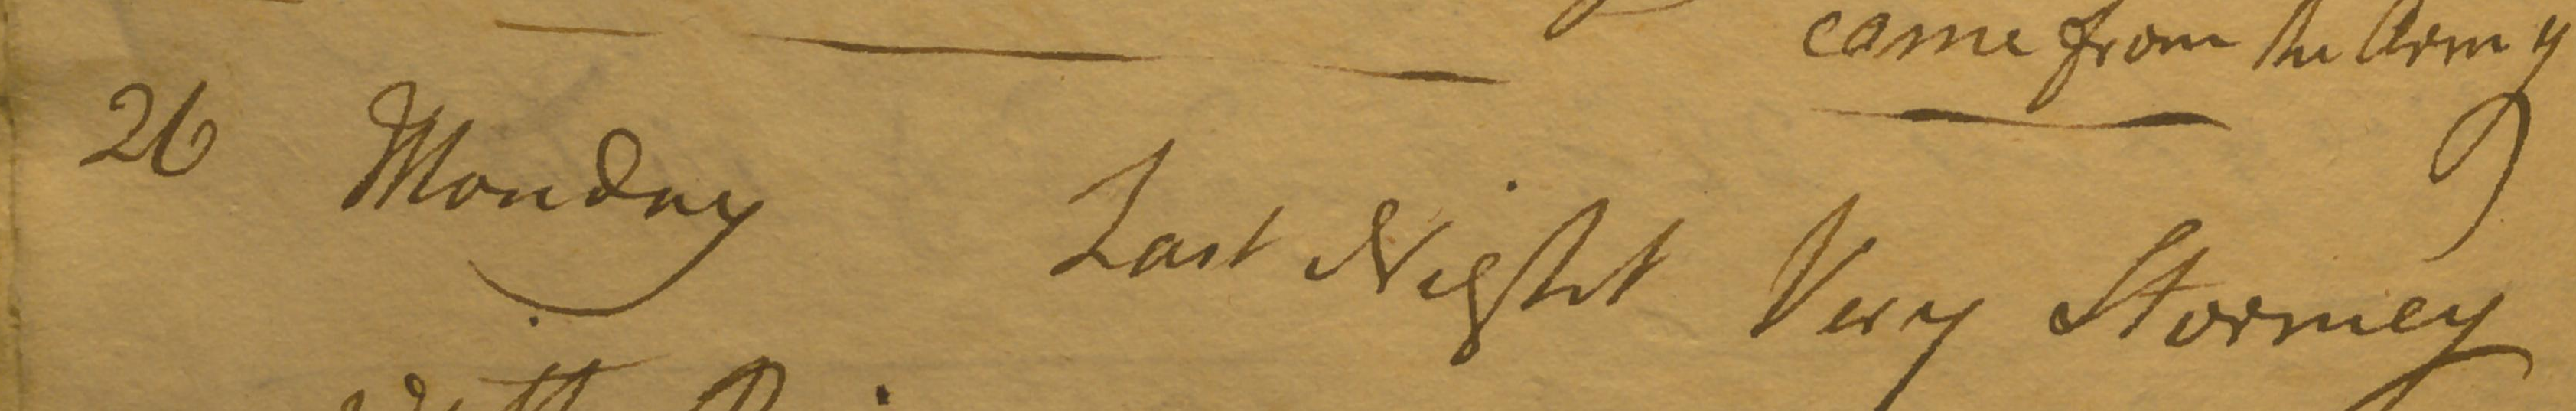26 Monday Last Night Very Stormey
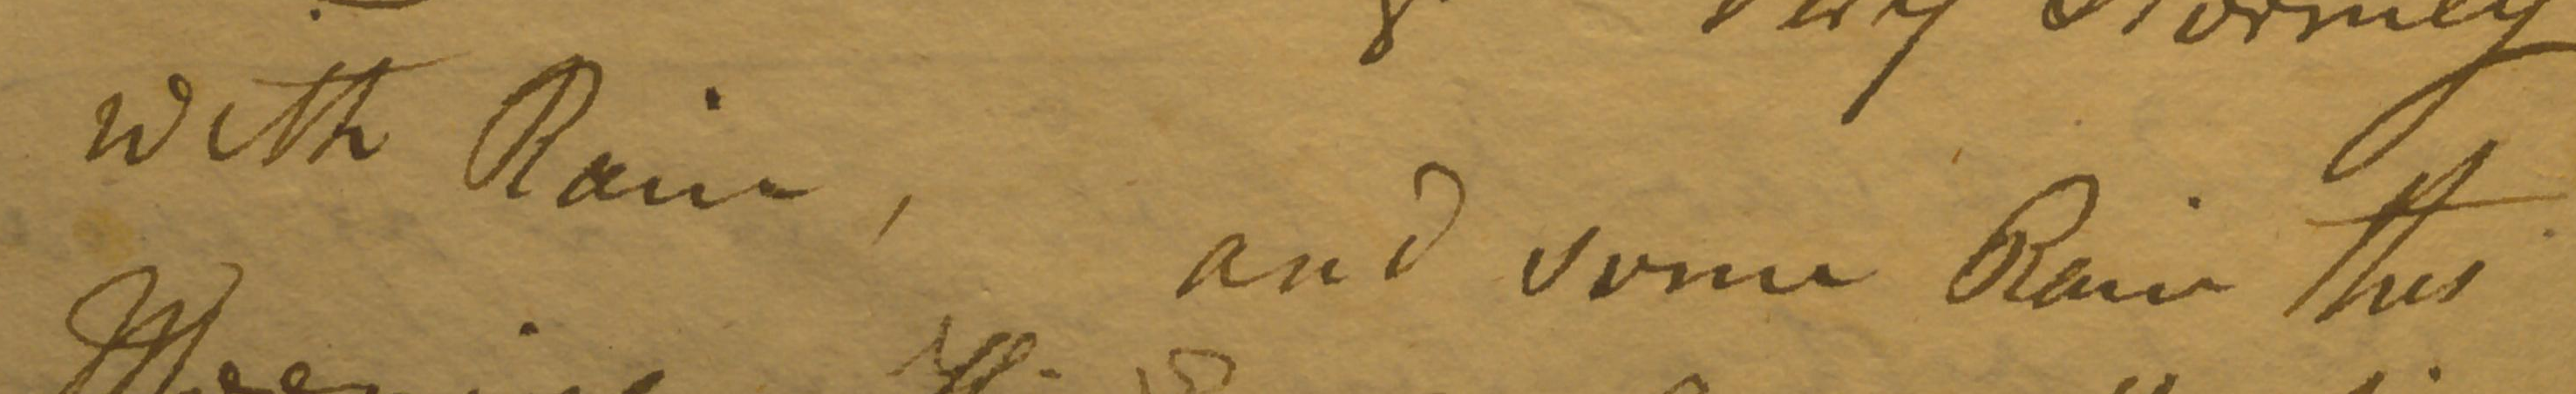with Rain, and some Rain this
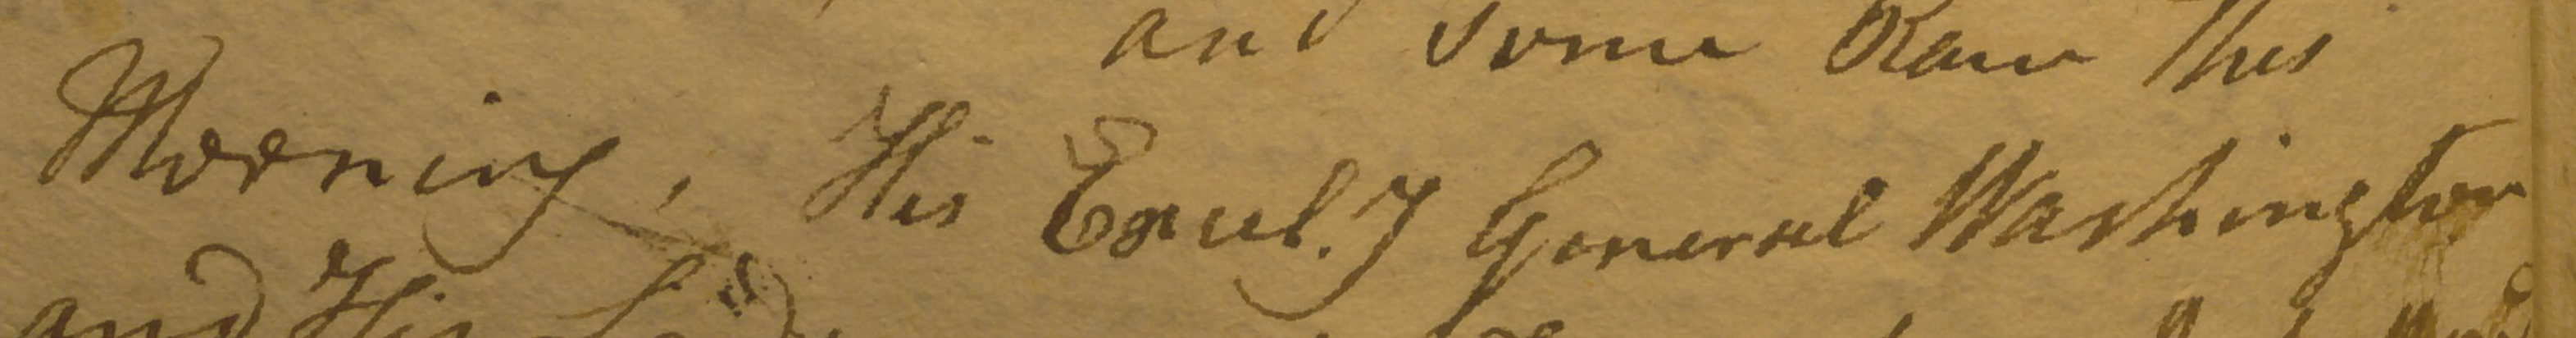Morning, His Excel^y. General Washington
